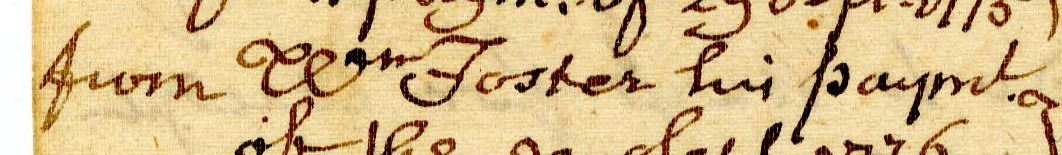from W^m Foster his paym^t.
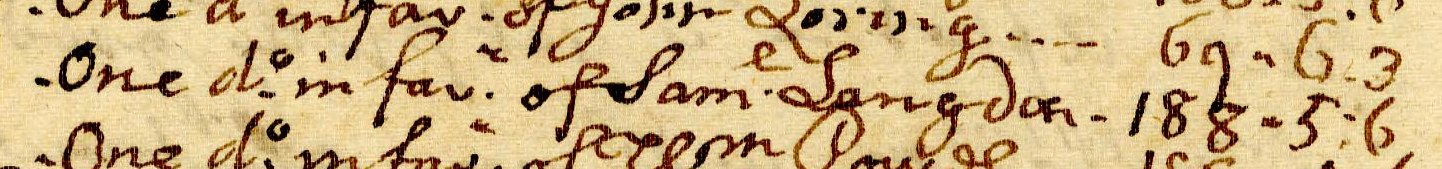One d^o. in fav^r. of Sam^l Langdon- 188.5..6
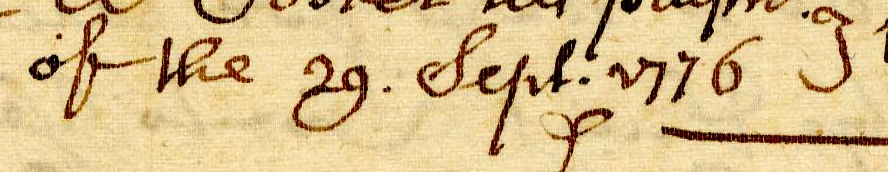of the 29. Sept^t. 1776
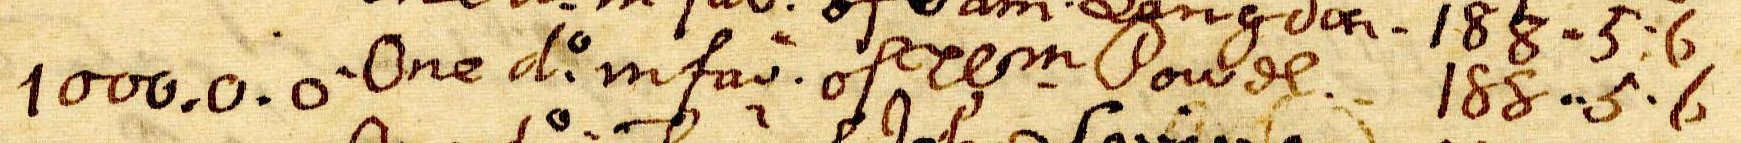1000.0.0 One d^o. in fav^r. of W^m Powel.- 188..5.6
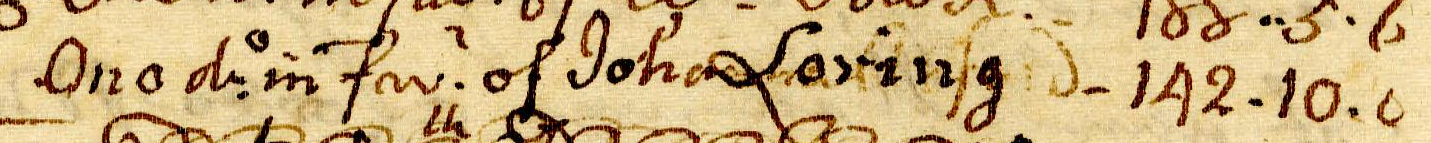One d^o. in fav^r. of John Loring -142.10.0
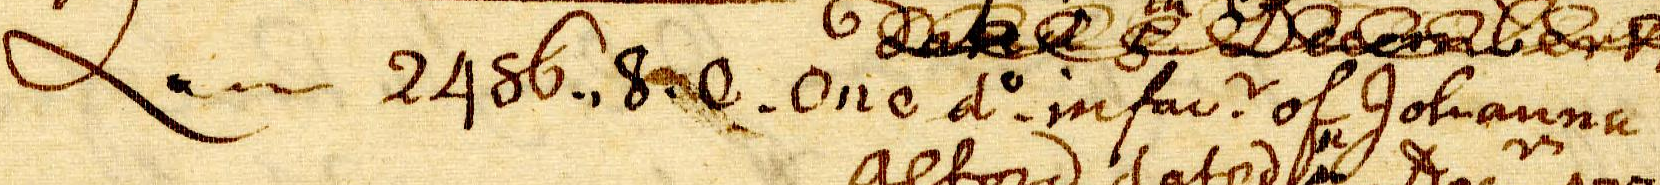L- 2486..8.0. One d^o. in fav^r. of Johanna
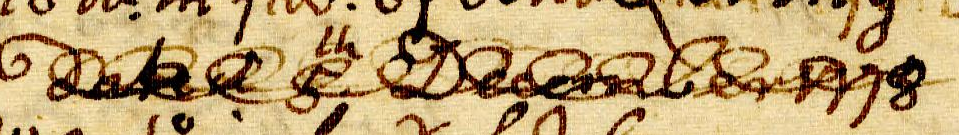[____ 5^th. December 1778]
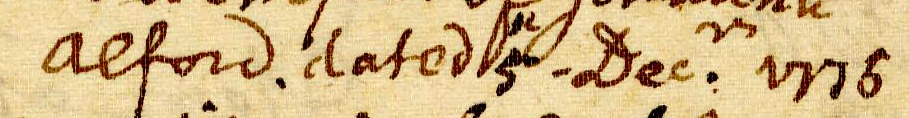Alford. dated 5^th-Dec^r. 1776
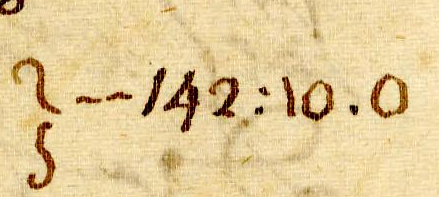--142:10.0
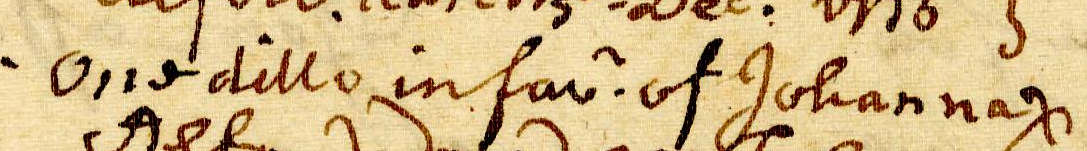One ditto in fav^r. of Johanna
